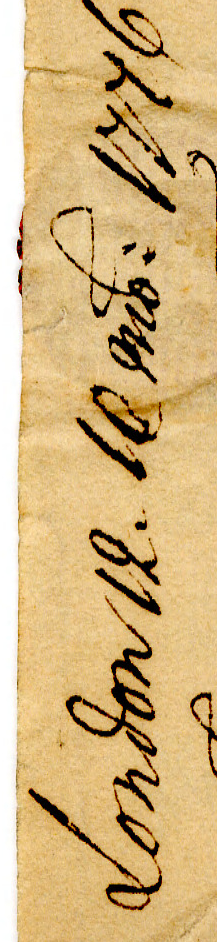London 12. 10mo: 1776
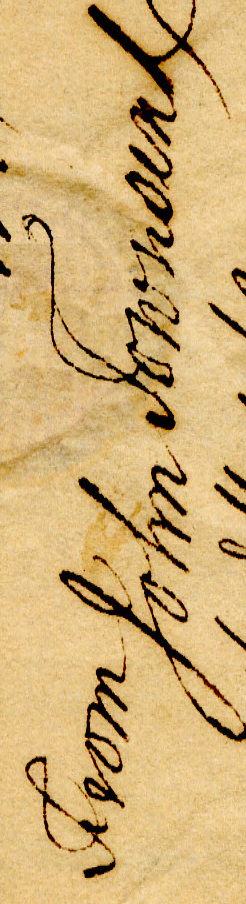From John Townsend
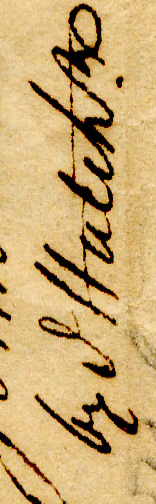by J. Hutch^n.
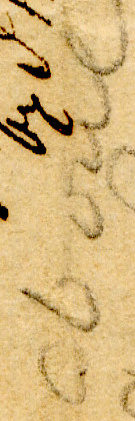about
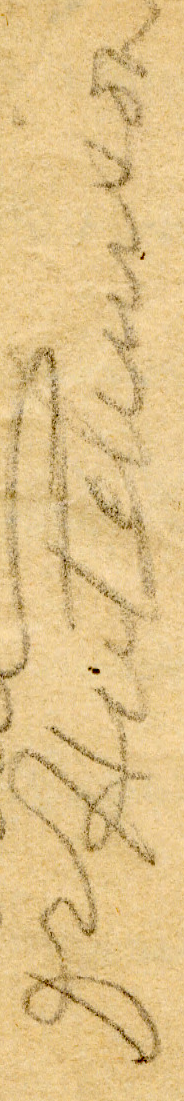Dr Hutchinson
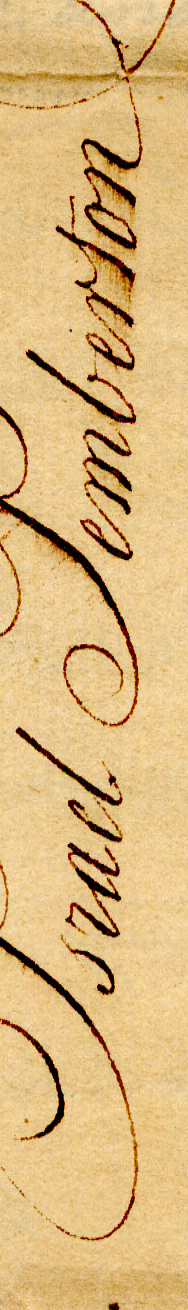Israel Pemberton
